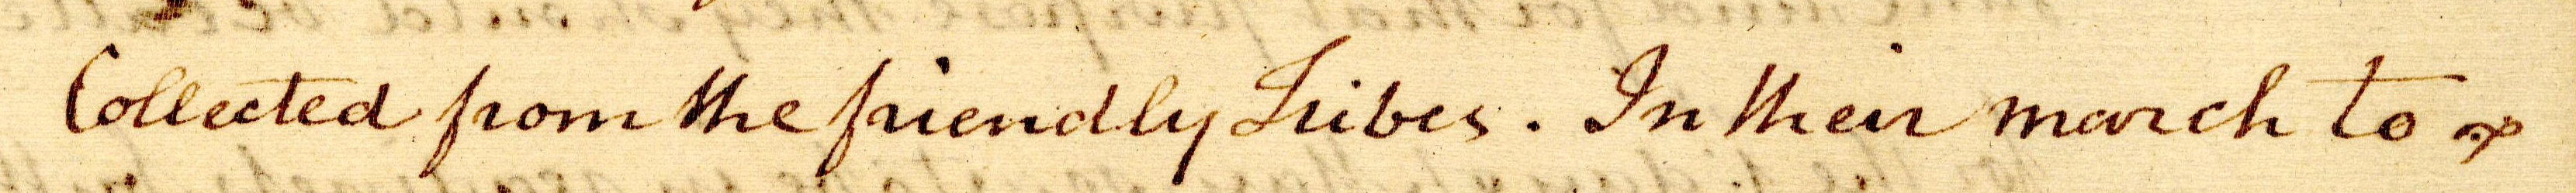Collected from the friendly Tribes. In their march to
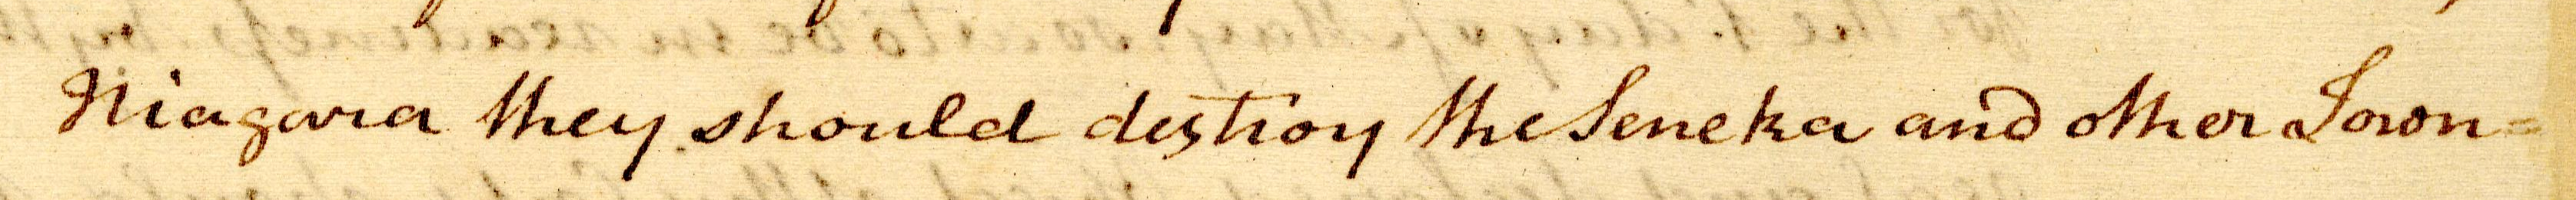Niagara they should destroy the Seneka and other Town-
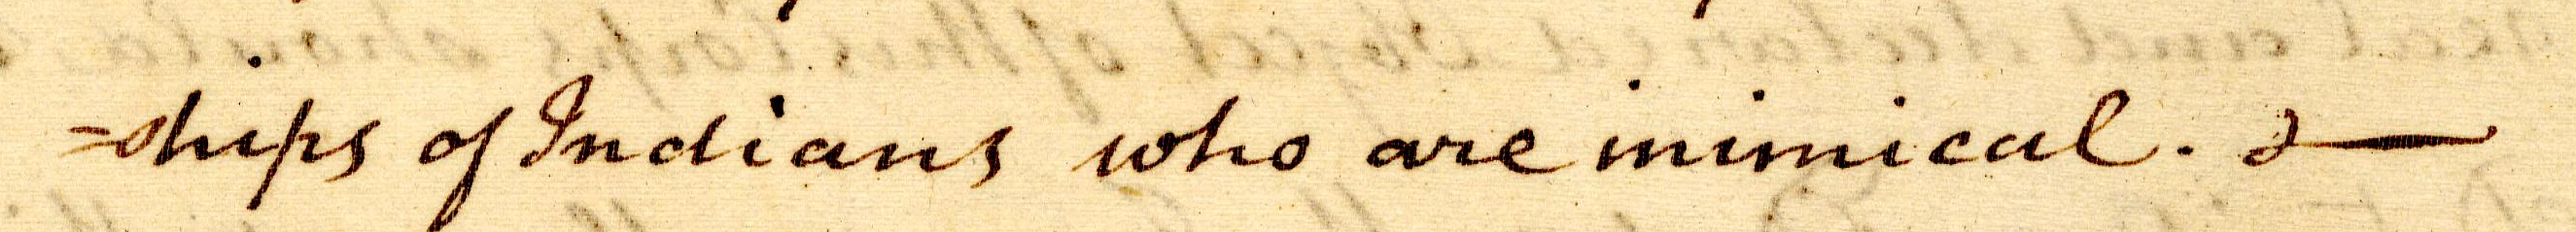-ships of Indians who are inimical. -
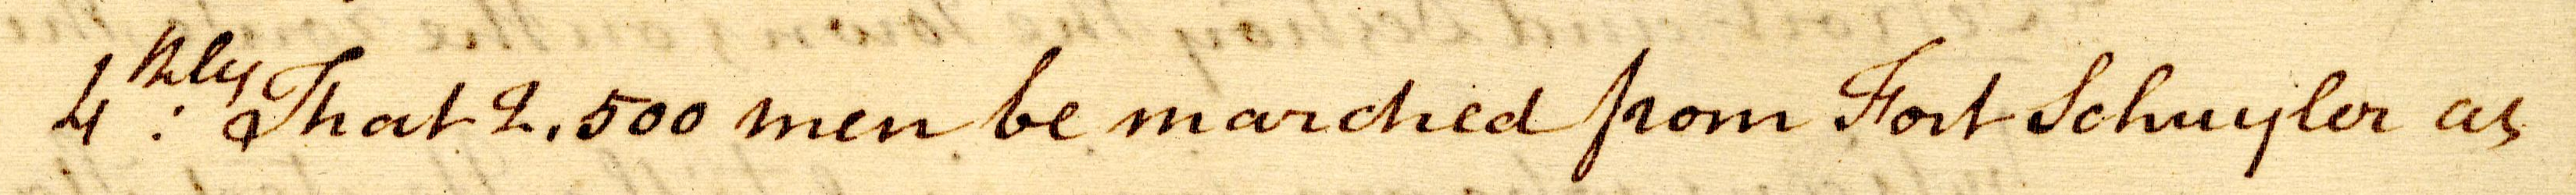4^thly: That 2,500 men be marched from Fort Schuyler as
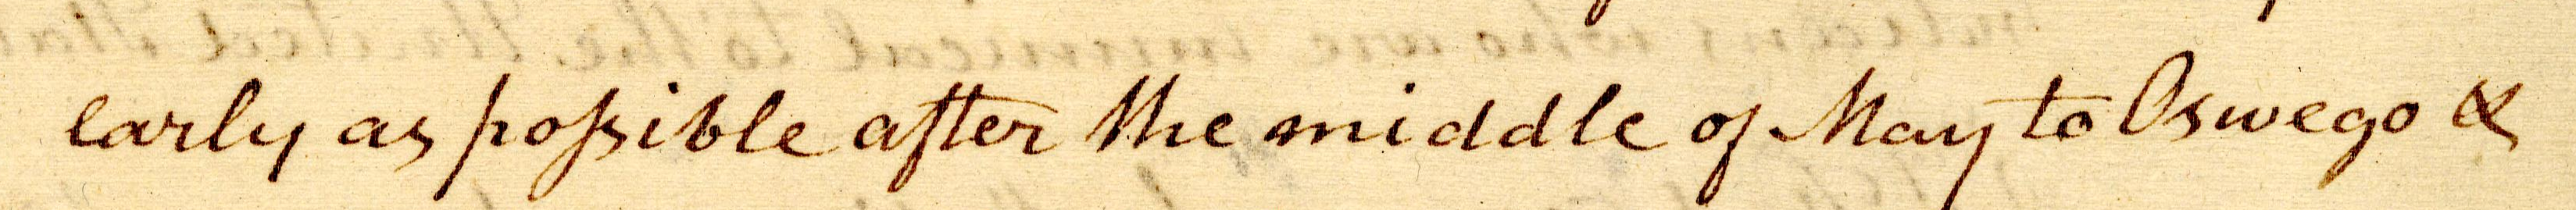early as possible after the middle of May to Oswego &
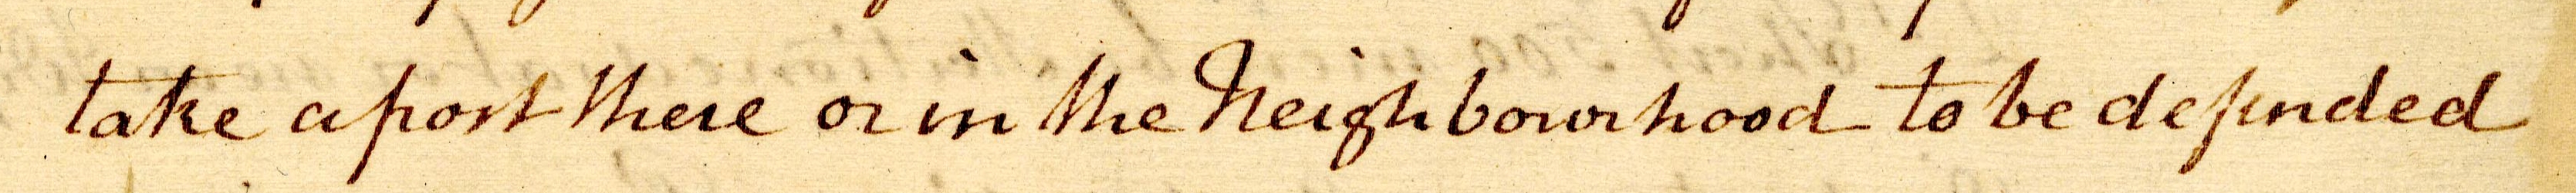take a post there or in the Neighborhood to be defended
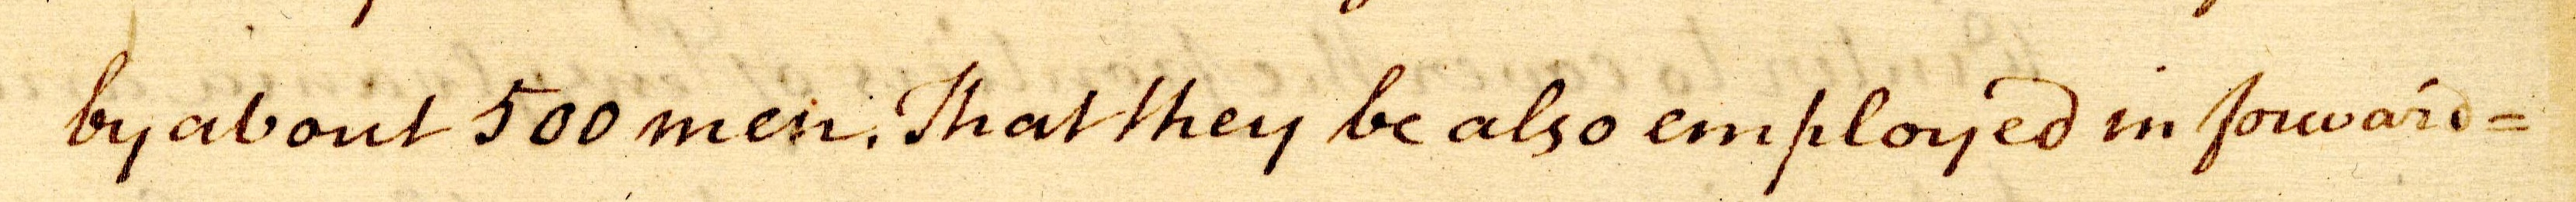by about 500 men. That they be also employed in forward-
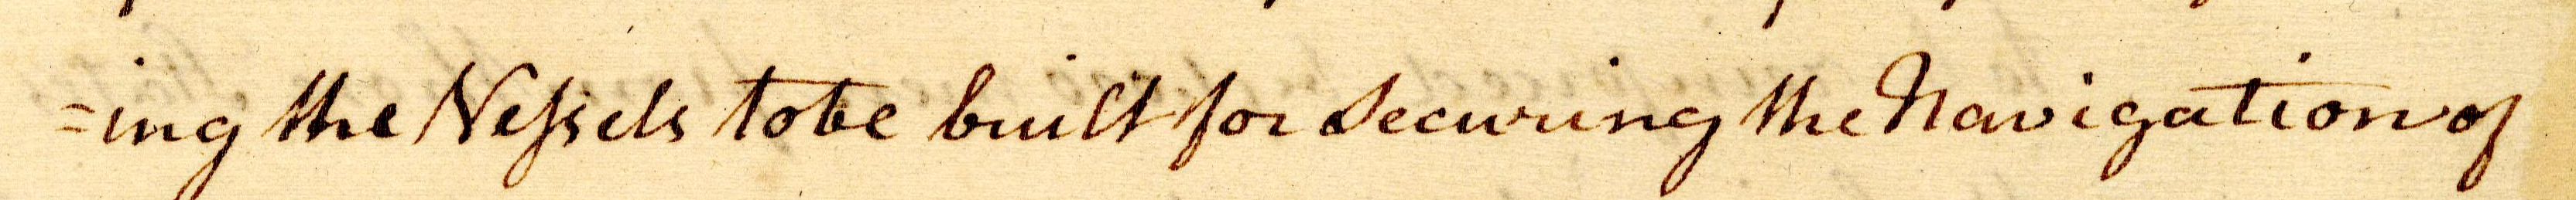-ing the Vessels to be built for Securing the Navigation of
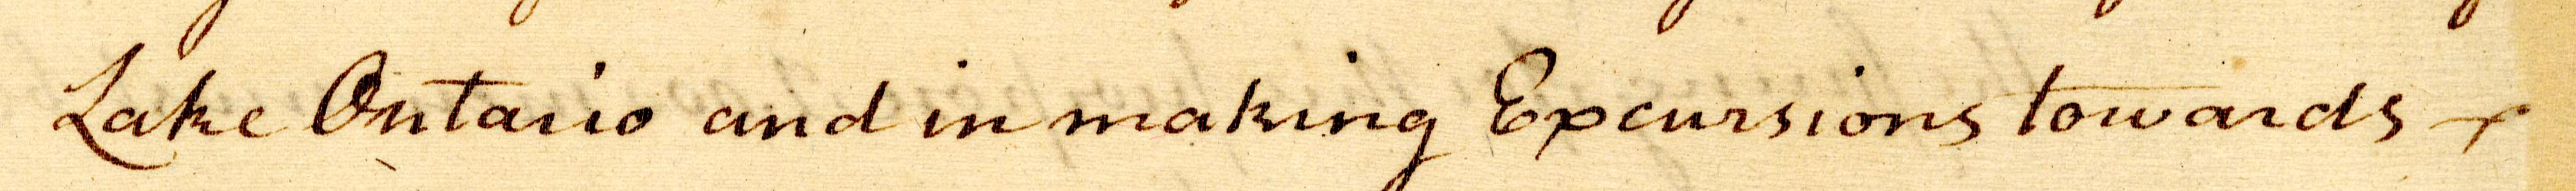Lake Ontario and in making Excursions towards
